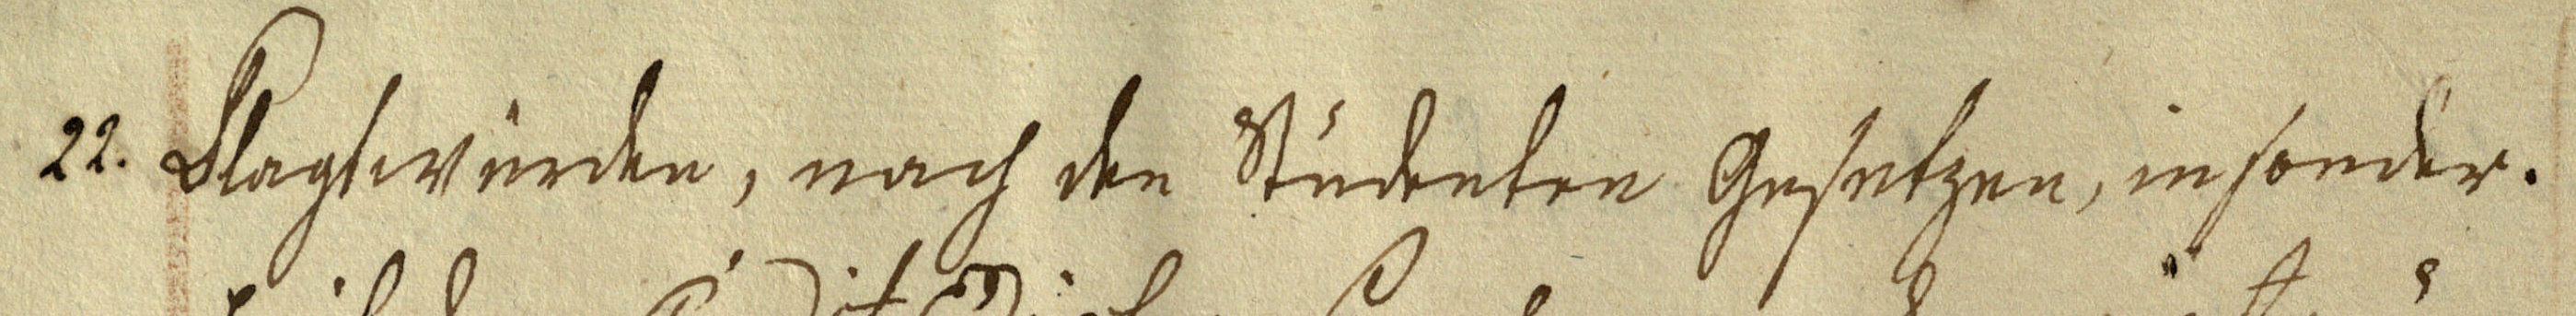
klagt würden, nach den Studenten Gesetzen, insonder¬
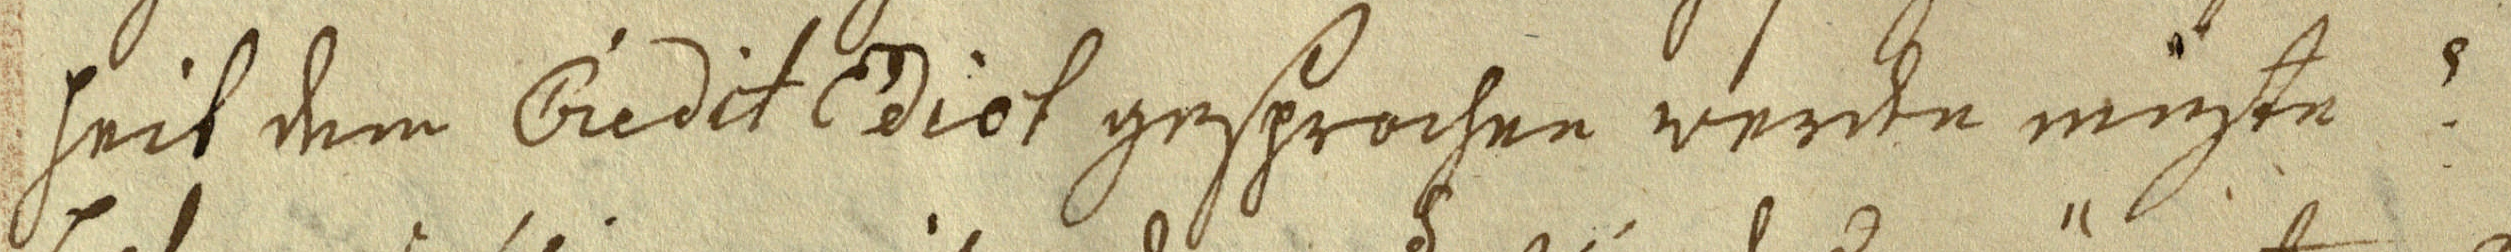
heit dem CreditEdict gesprochen werden müßte!
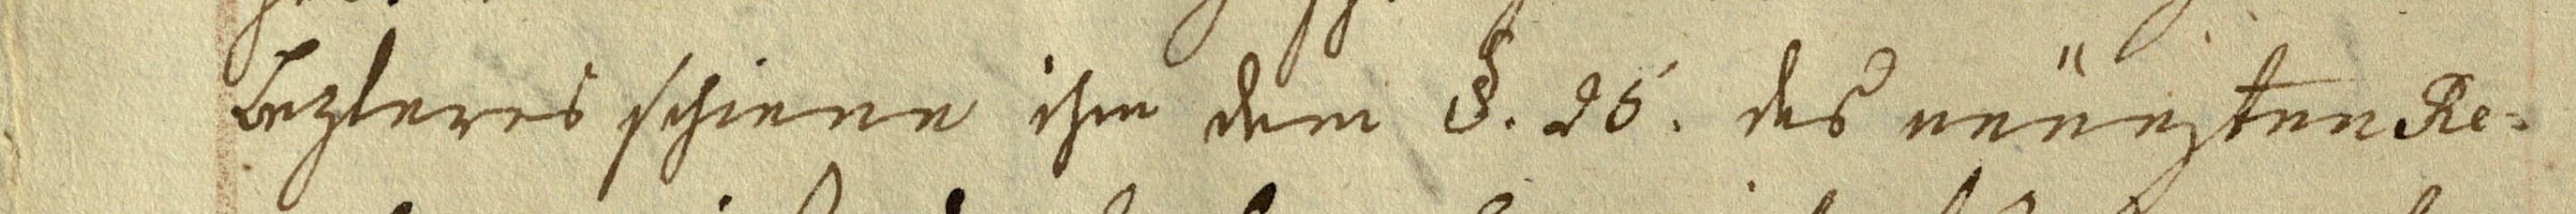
Lezteres schiene ihm dem §. 25. des neuesten Re¬
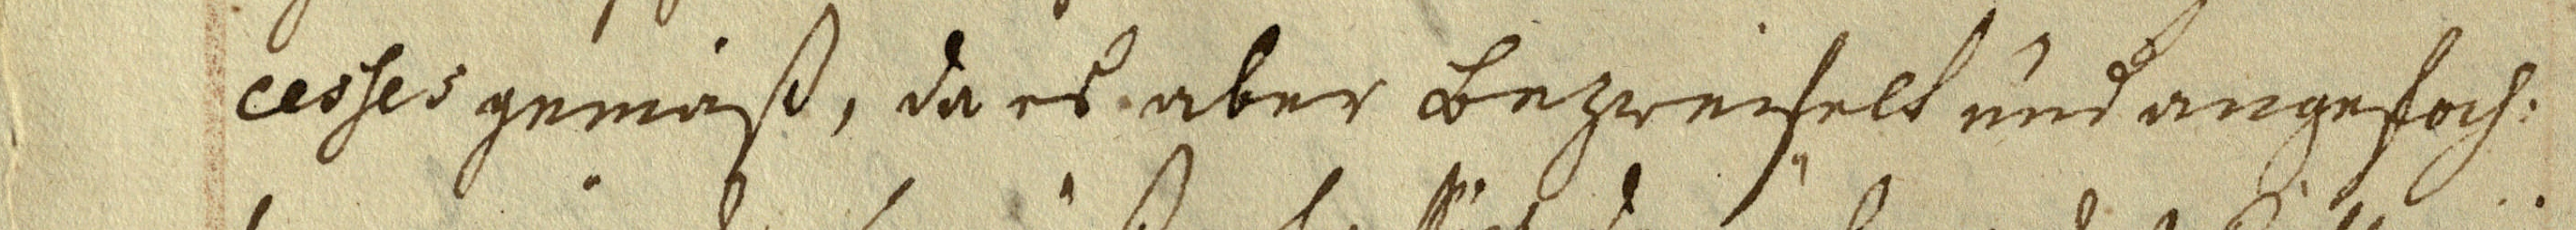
cesses gemäß, da es aber bezweifelt und angefoch¬
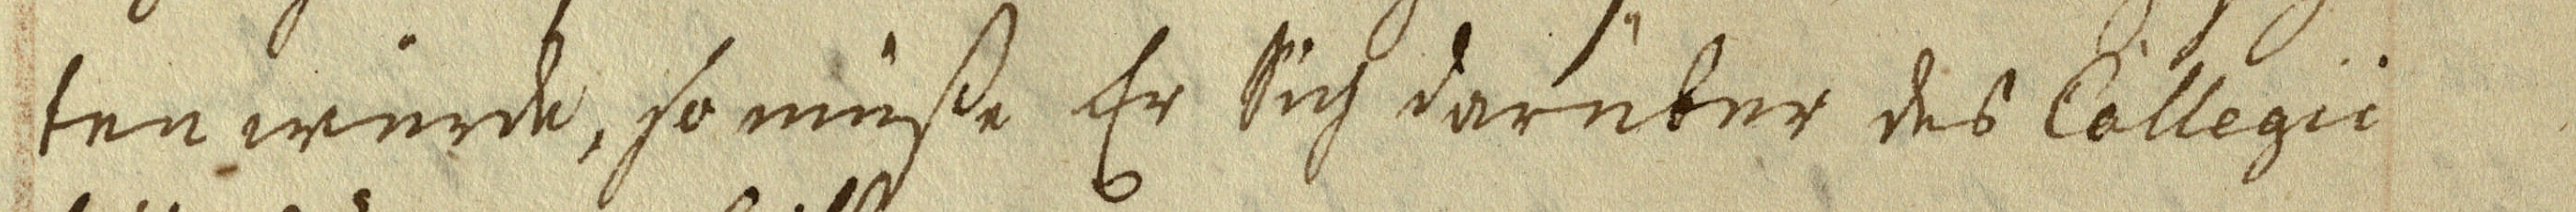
ten würde, so müße Er Sich darüber des Collegii
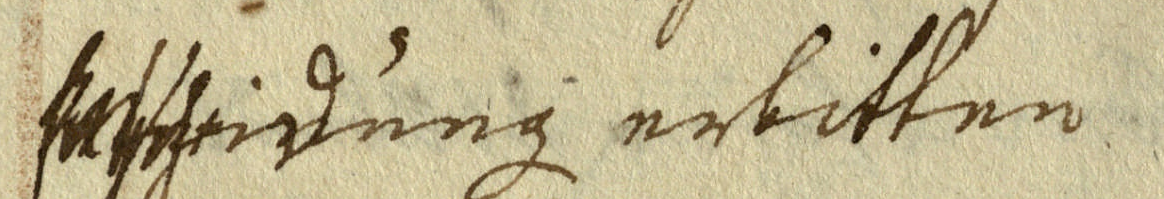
Entscheidung erbitten.
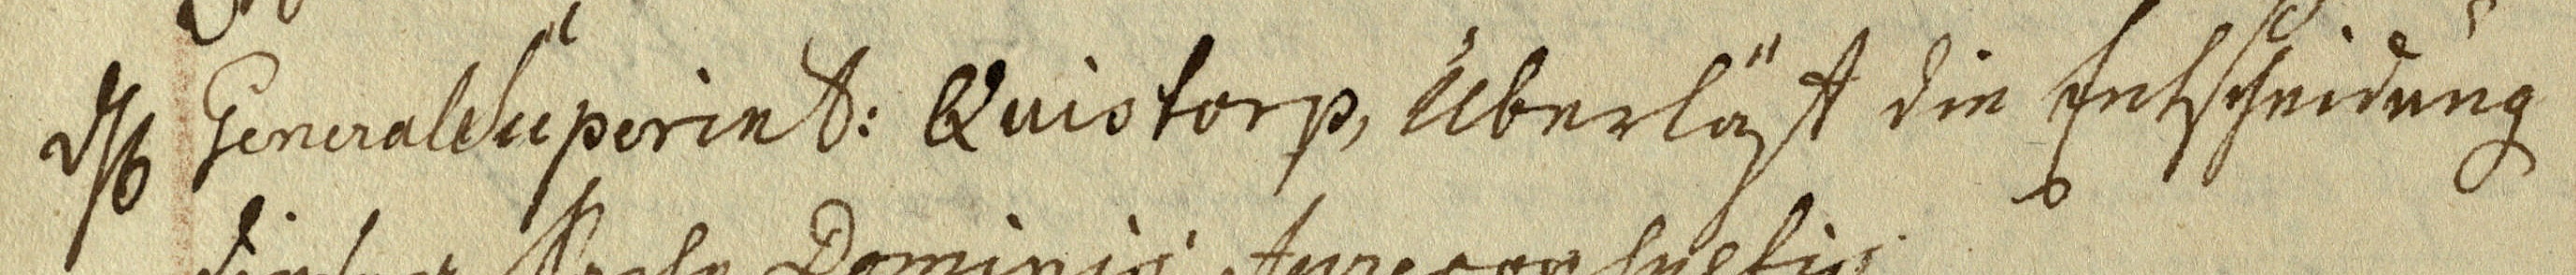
dh GeneralSuperint: Quistorp, überläßt die Entscheidung
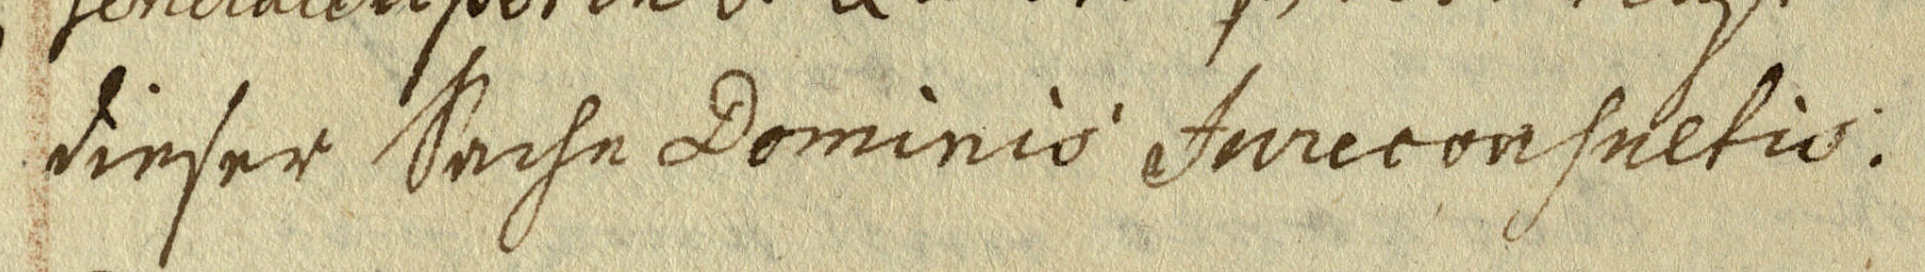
dieser Sache Dominis Jureconsultis.
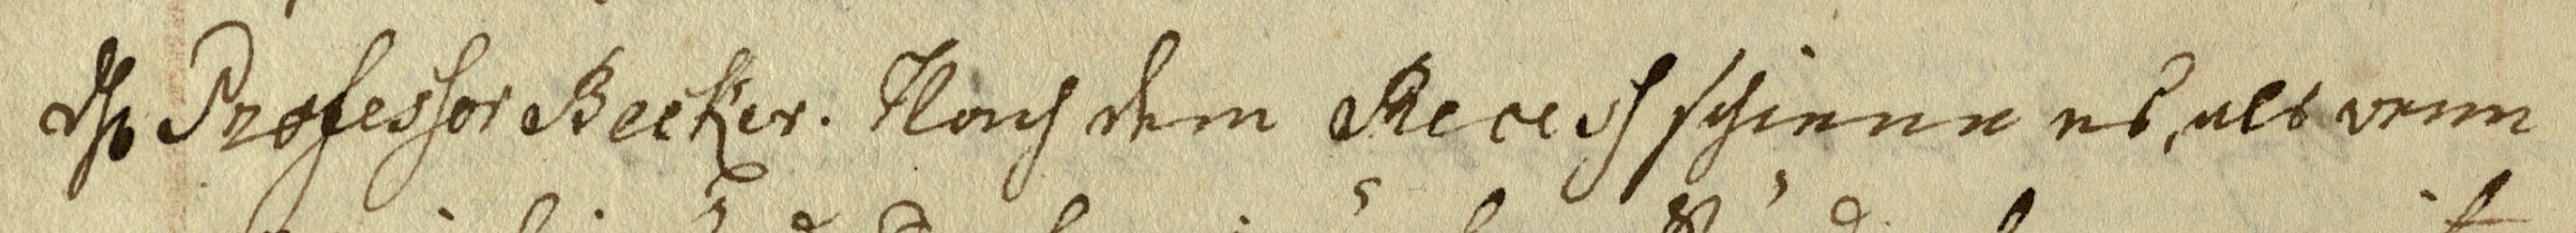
dh Professor Becker. Nach dem Recess schiene es, als wenn
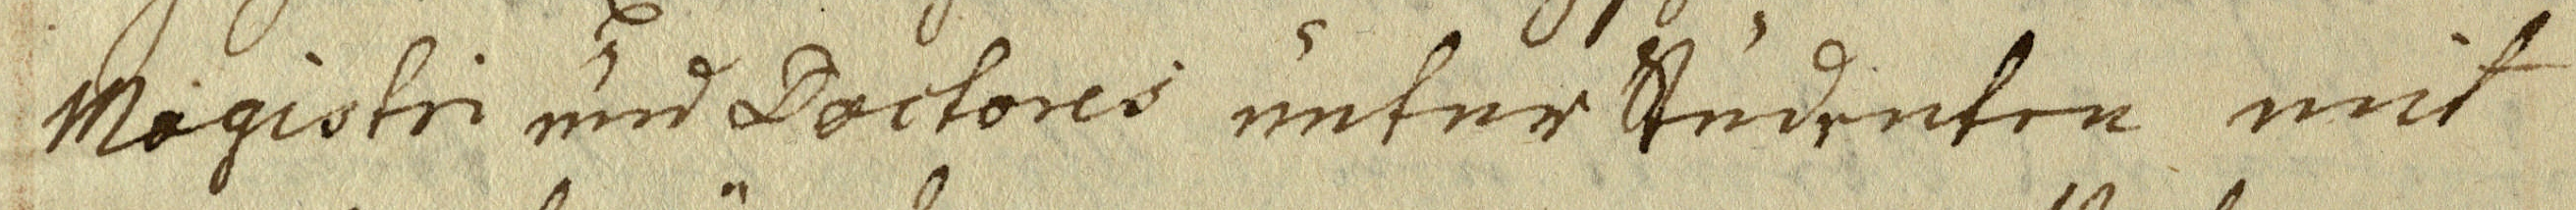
Magistri und Doctores unter Studenten mit
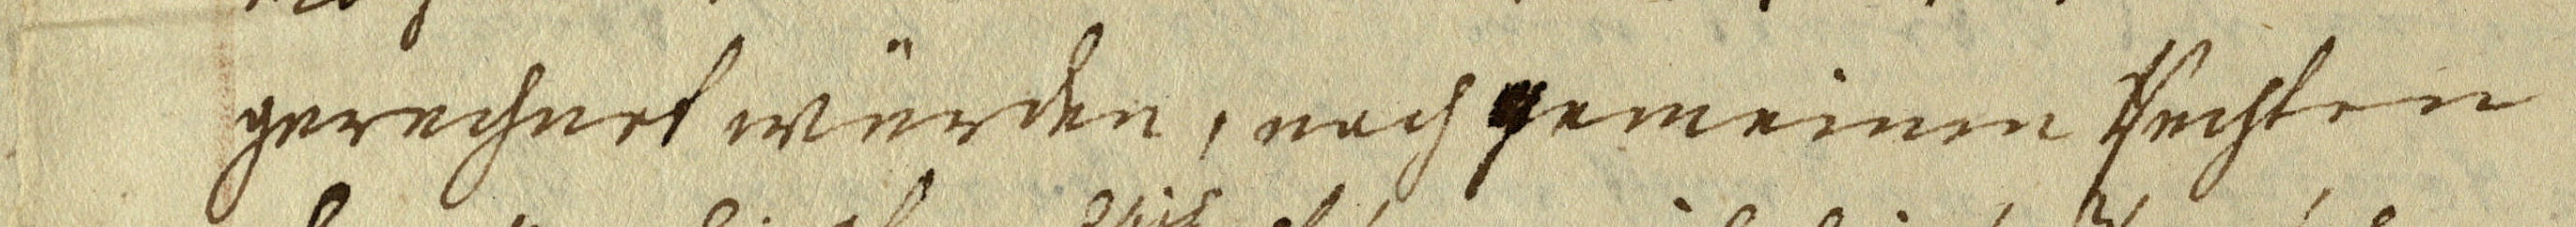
gerechnet würden, nach gemeinen Rechten
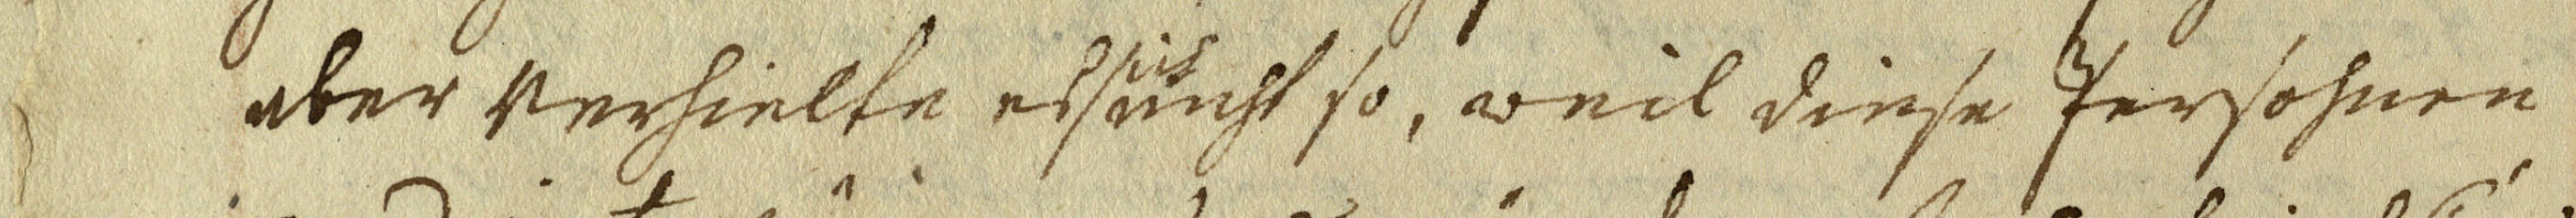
aber verhielt es sich nicht so, weil diese Persohnen
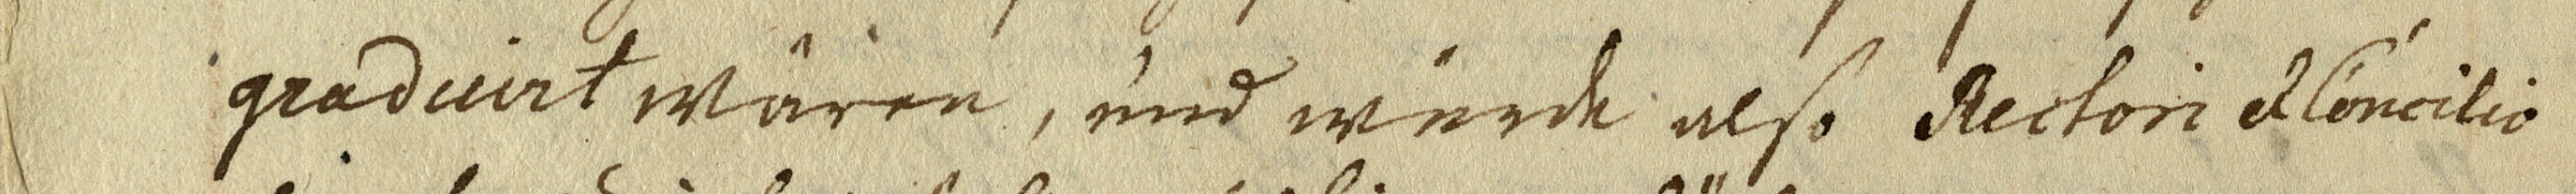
graduirt wären, und würde also Rectori et Concilio
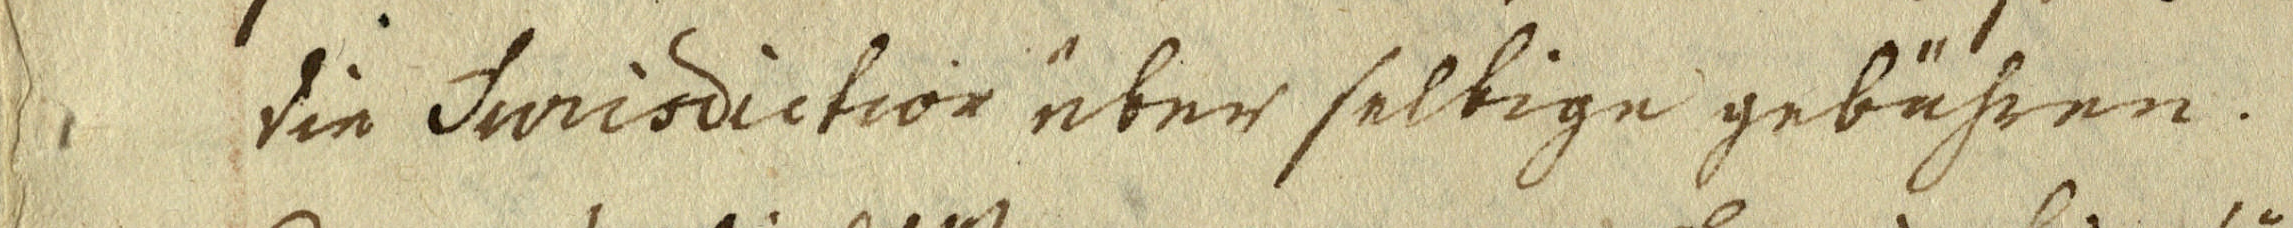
die Jurisdiction über selbige gebühren.
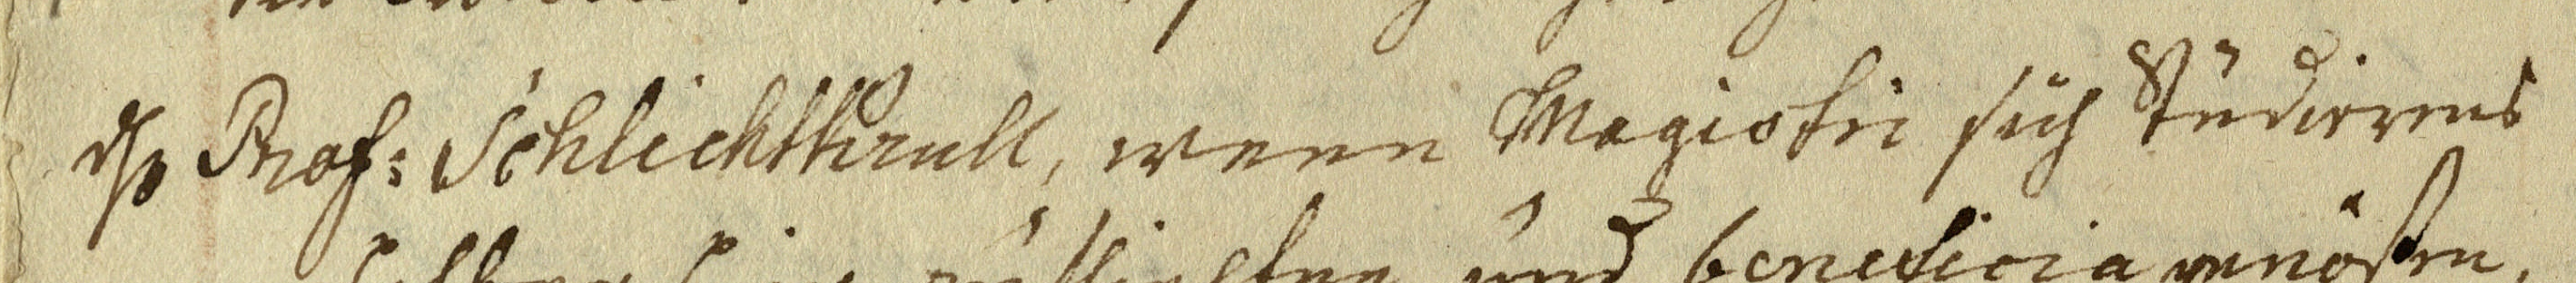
dh Prof: Schlichtkrull, wenn Magistri sich Studierens
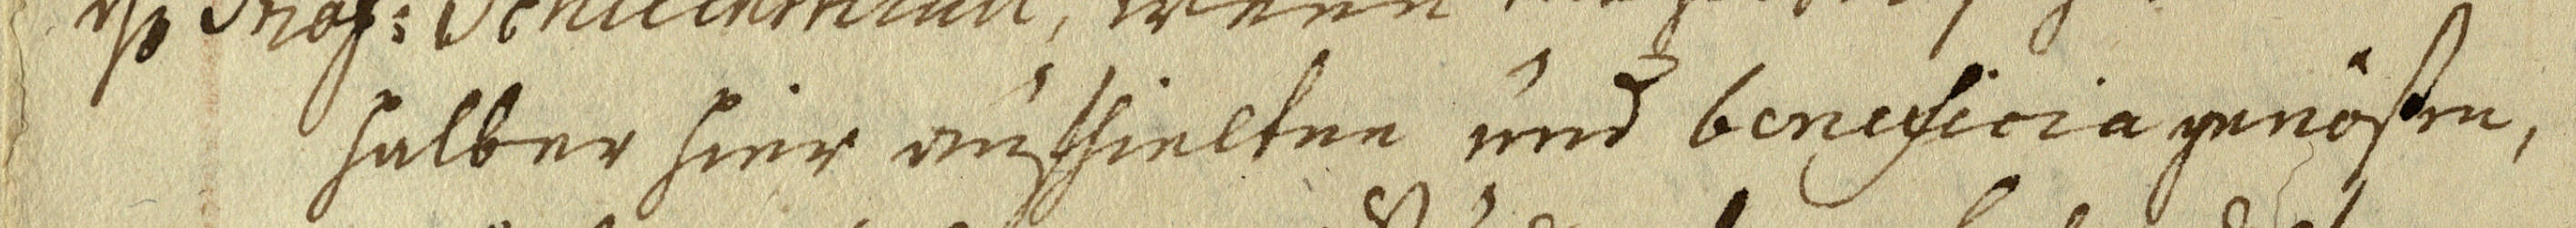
halber hier aufhielten, und beneficia genößen,
